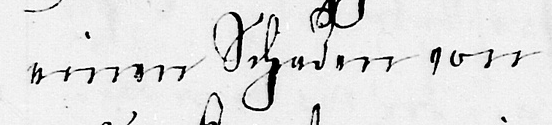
einen Schaden von
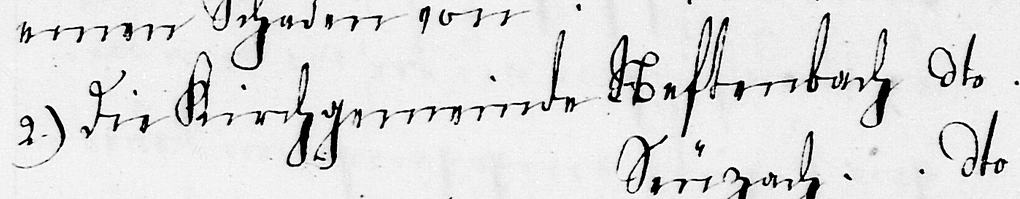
2.) Die Kirchgemeinde Neftenbach dto
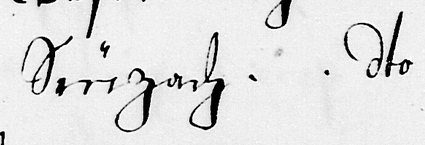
Seuzach dto
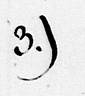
3.)
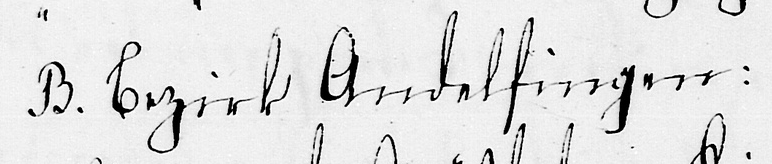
B. Bezirk Andelfingen:
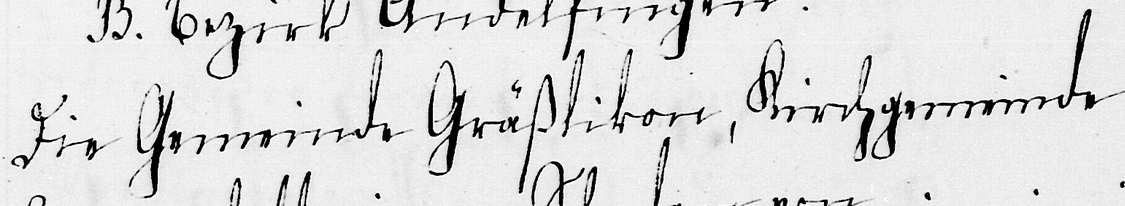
Die Gemeinde Gräßlikon, Kirchgemeinde
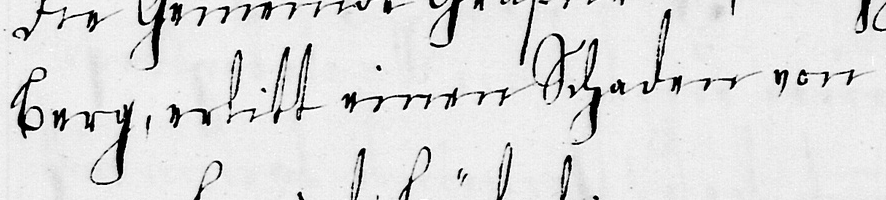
Berg, erlitt einen Schaden von
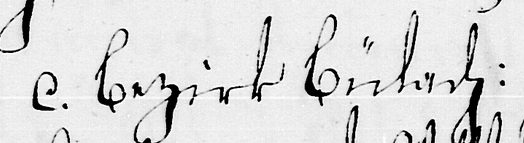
C. Bezirk Bülach:
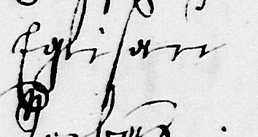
Eglisau
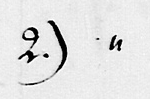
2.) “
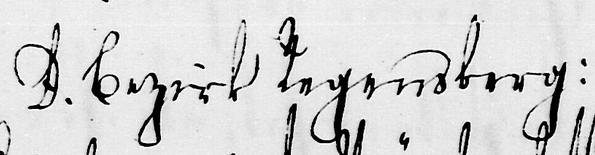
D. Bezirk Regensberg:
